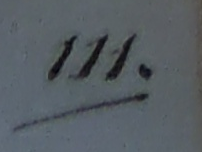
111.
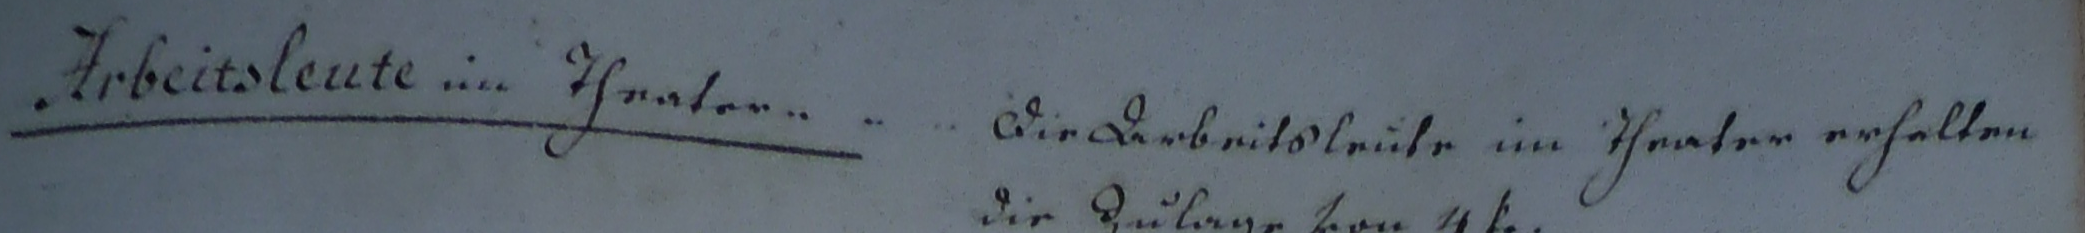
Arbeitsleute im Theater .. .. .. Die Arbeitsleute im Theater erhalten
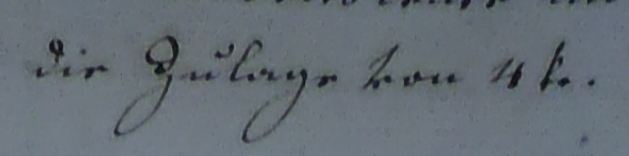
die Zulage von 14kr.
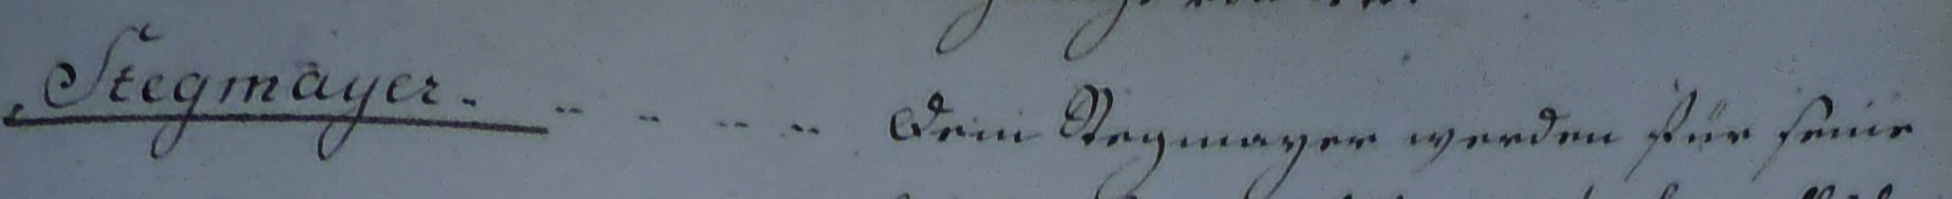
Stegmayer. .. .. .. .. Dem Stegmayer werden für seine
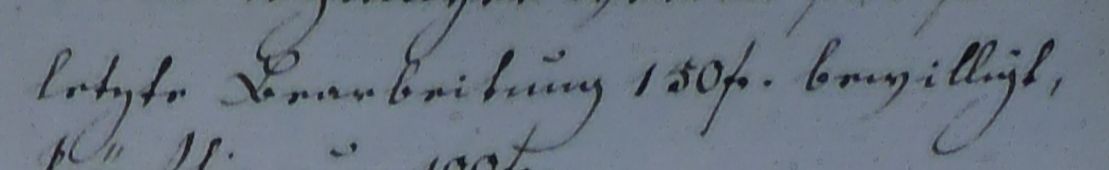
letzte Bearbeitung 150fr. bewilligt,
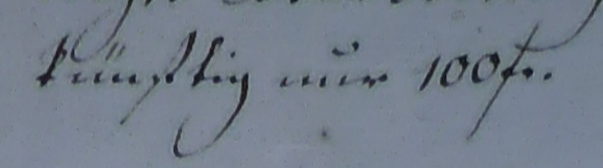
künftig nur 100fr.
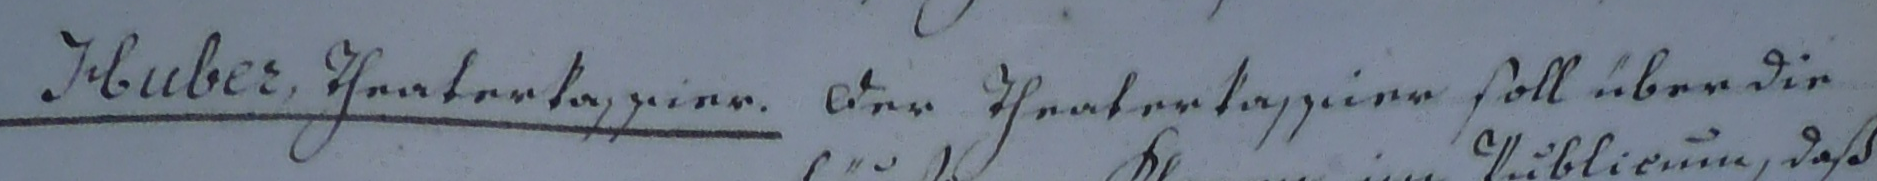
Huber, Theaterkassier. Der Theaterkassier soll über die
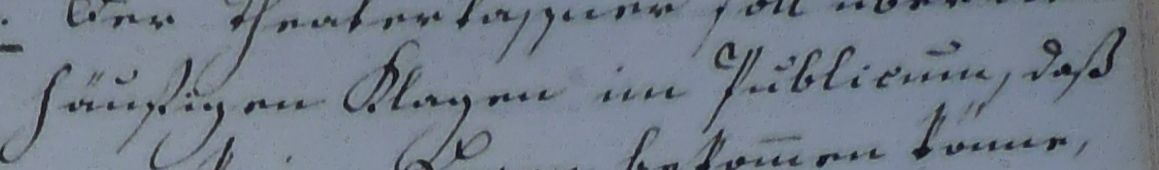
häufigen Klagen im Publicum, daß
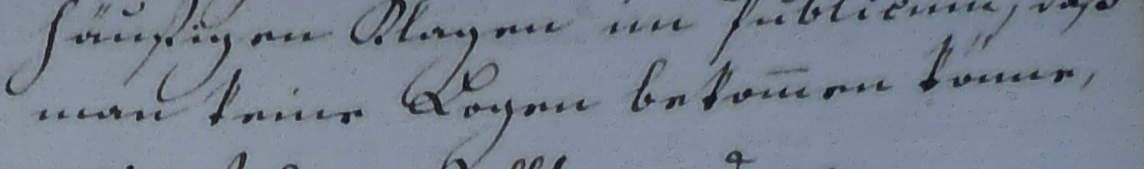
man keine Logen bekom̅en könne,
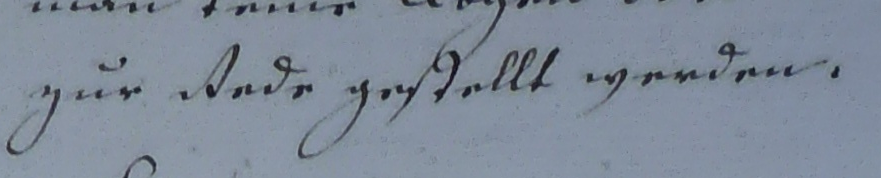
zur Rede gestellt werden.
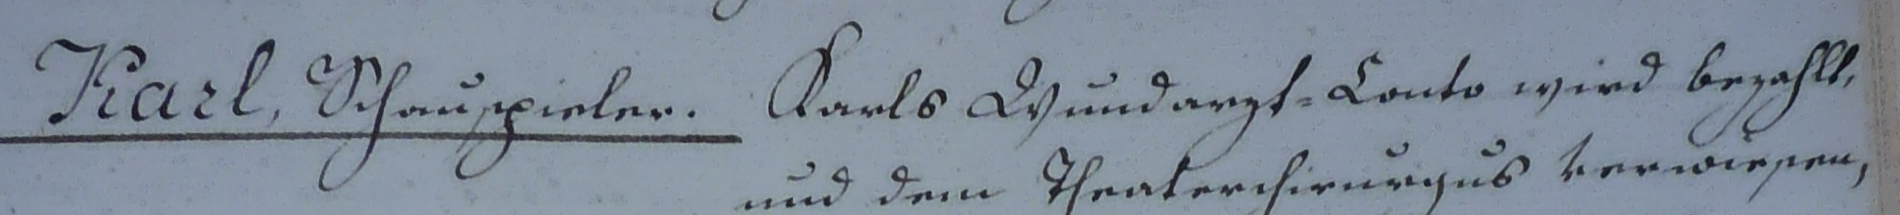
Karl, Schauspieler. Karls Wundarzt Conto wird bezahlt,
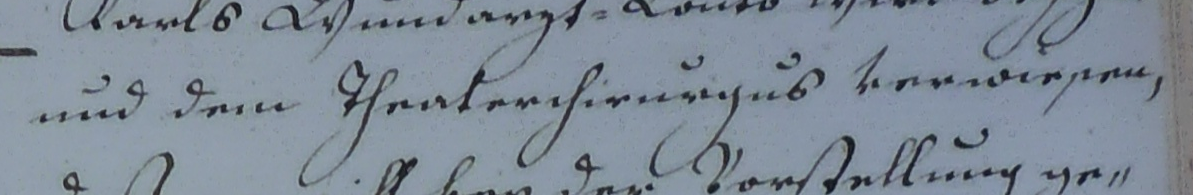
und dem Theaterchirurgus verwiesen,
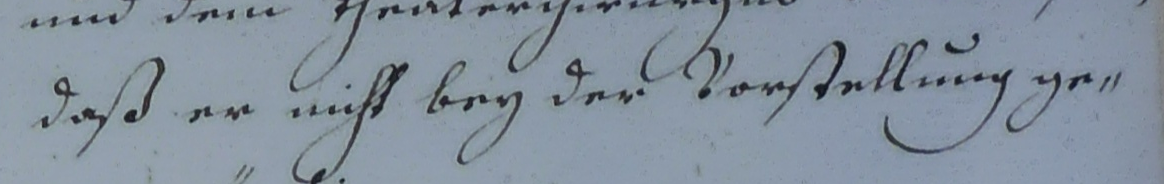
daß er nicht bey der Vorstellung ge¬
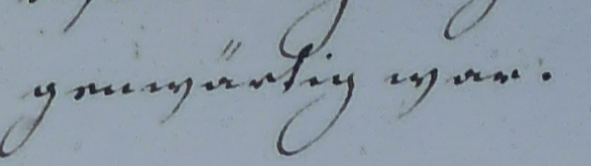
genwärtig war.
